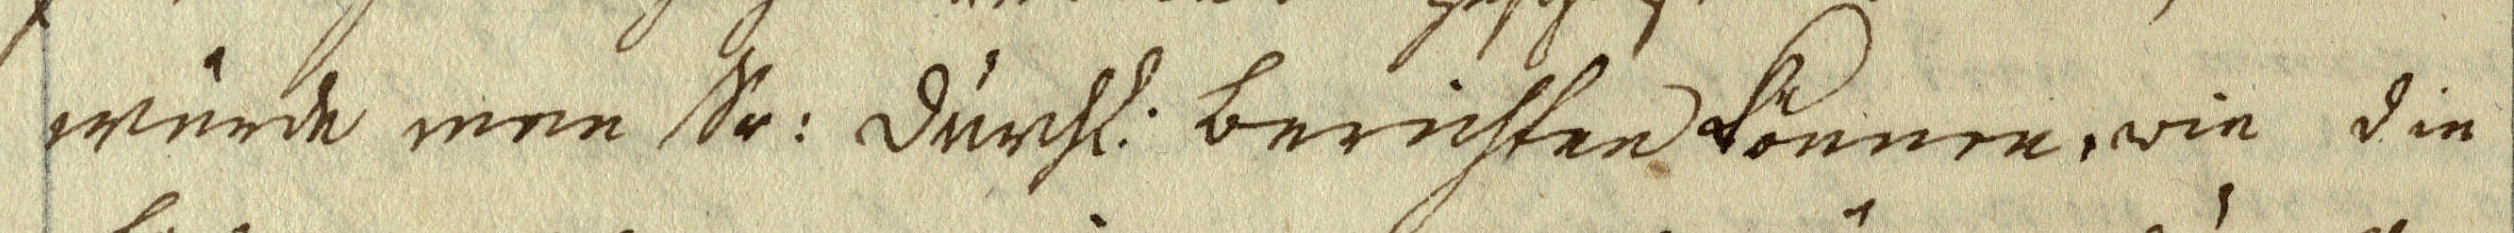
würde man Sr: Durchl. berichten können, wie die
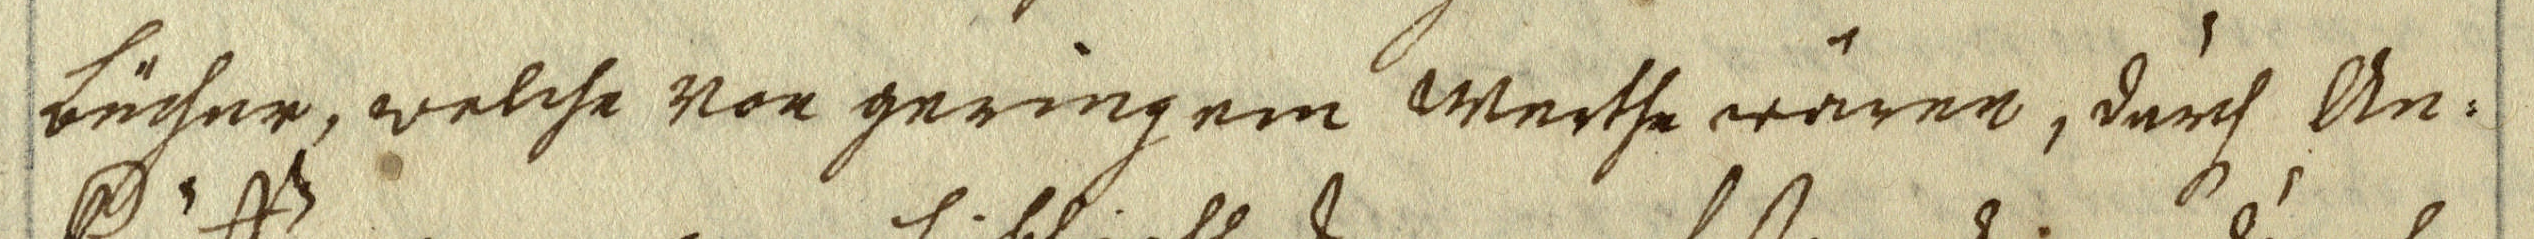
Bücher, welche von geringem Werthe wären, durch An¬
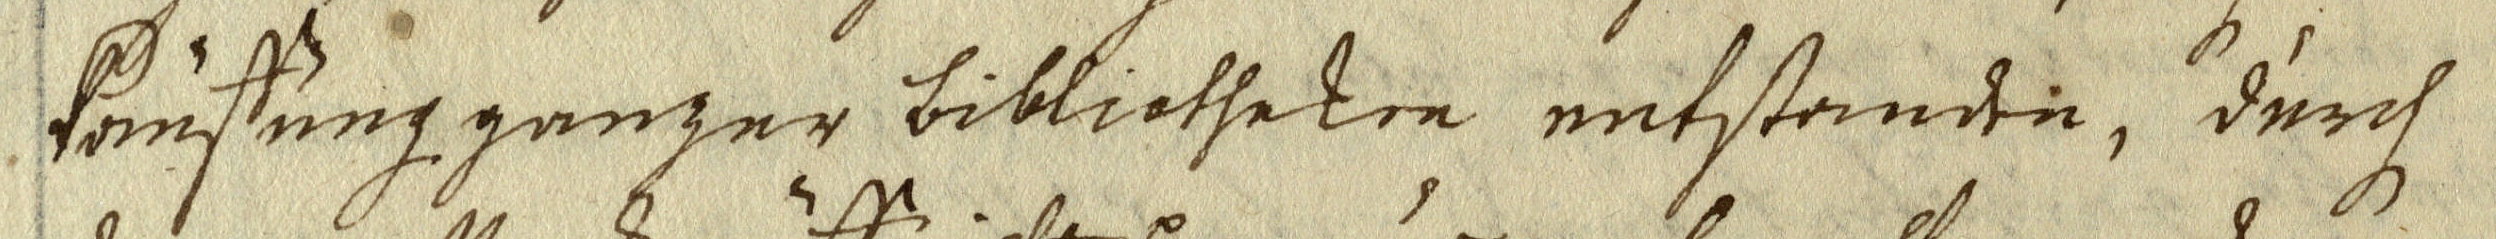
kaufung ganzer Bibliotheken entstanden, durch
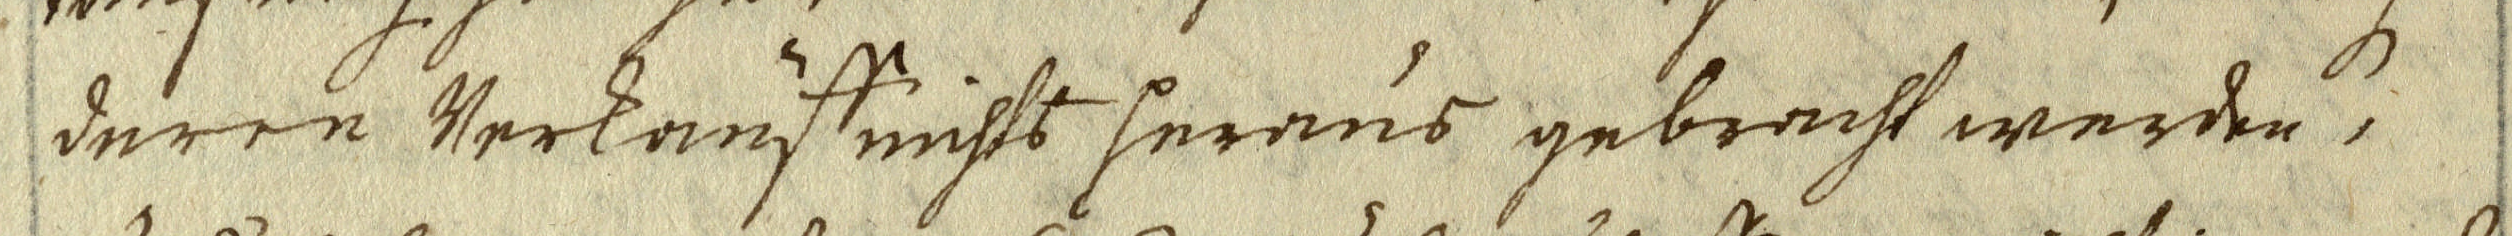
deren Verkauf nichts heraus gebracht werden,
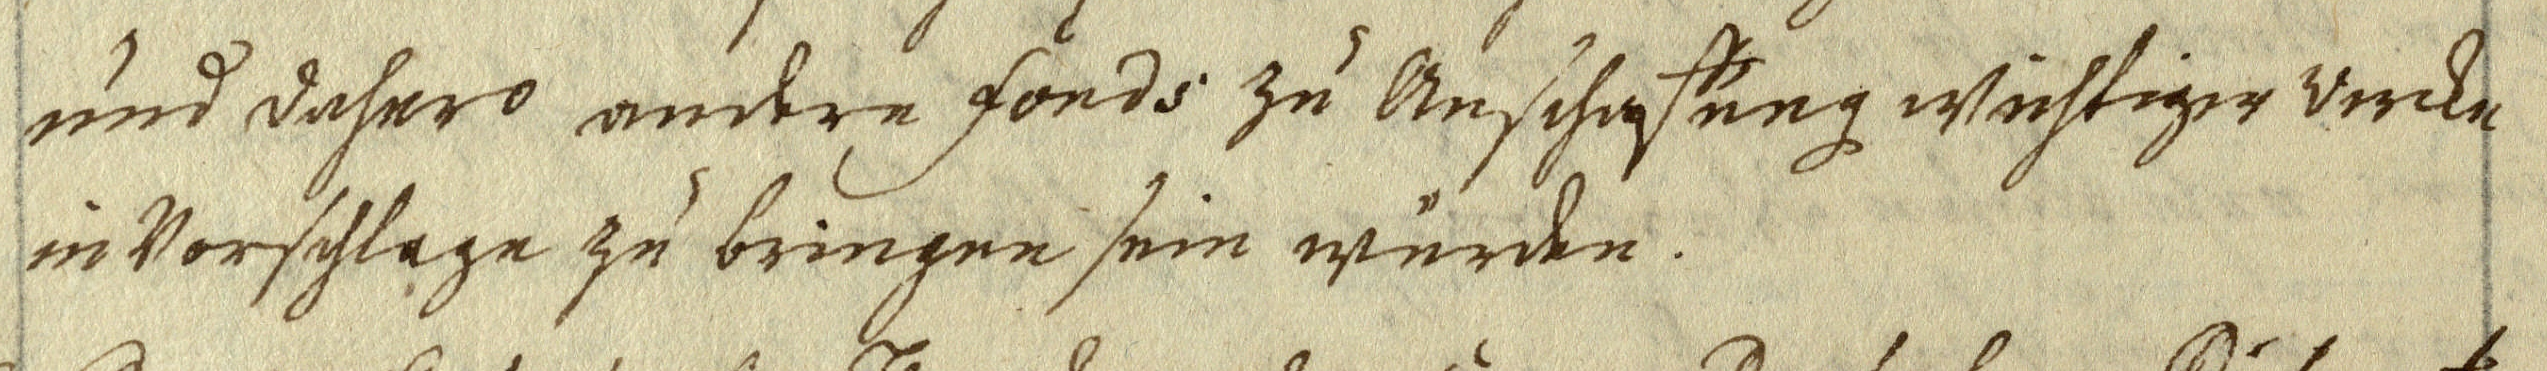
und dahero andere Fonds zu Anschaffung wichtiger Wercke
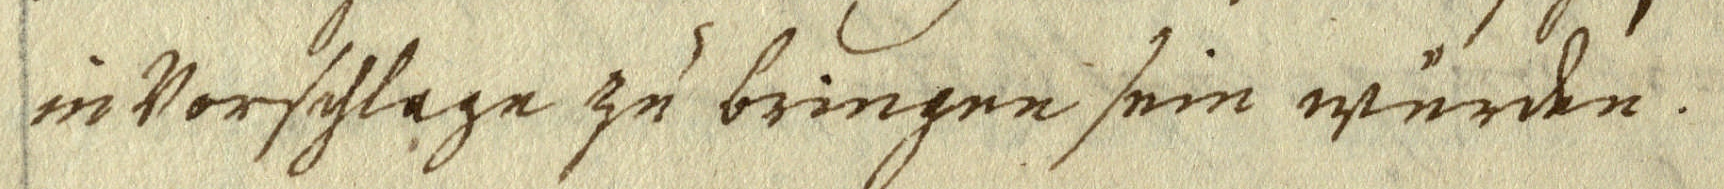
in Vorschlage zu bringen sein würden.
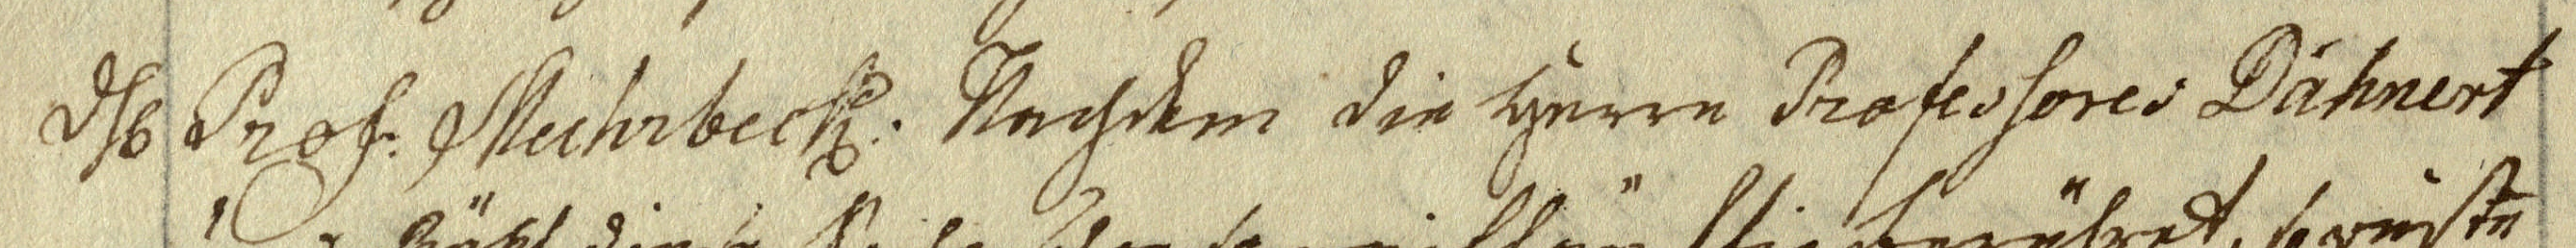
dh Prof. Muhrbeck. nachdem die Herrn Professores Dähnert
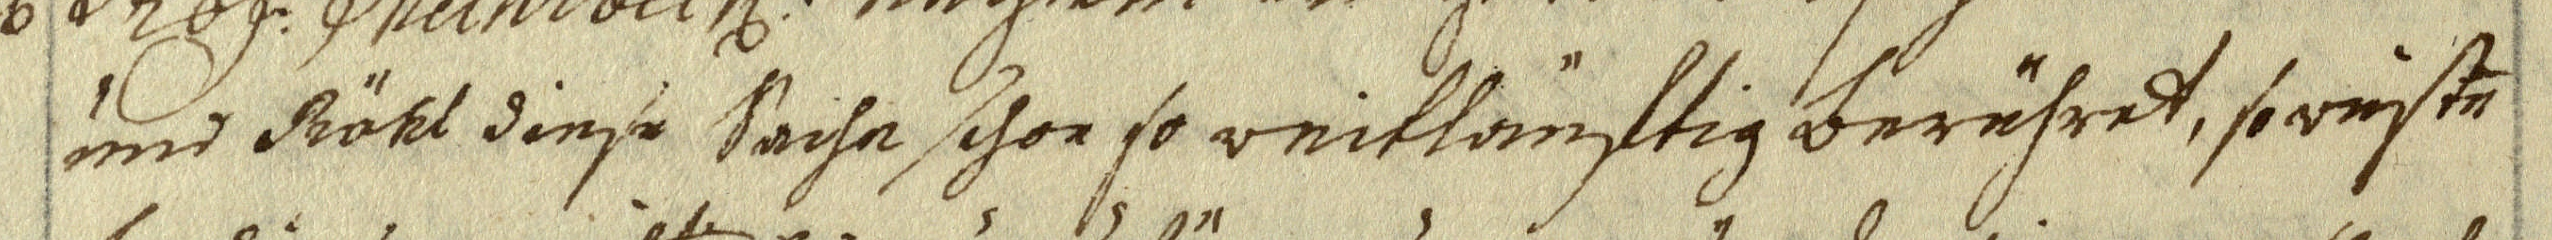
und Röhl diese Sache schon so weitläufig berühret, so wüste
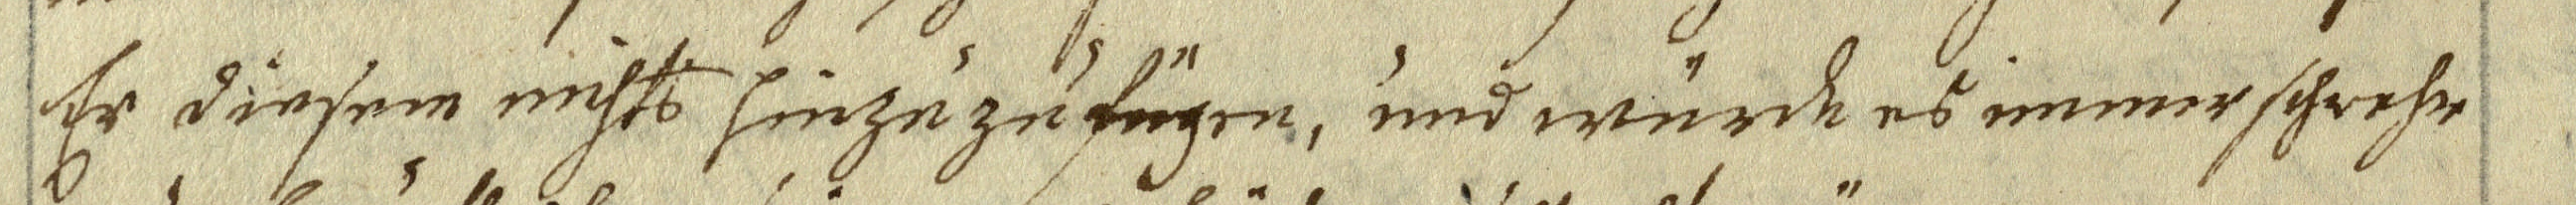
Er diesem nichts hinzu zufügen, und würde es immer schwehr
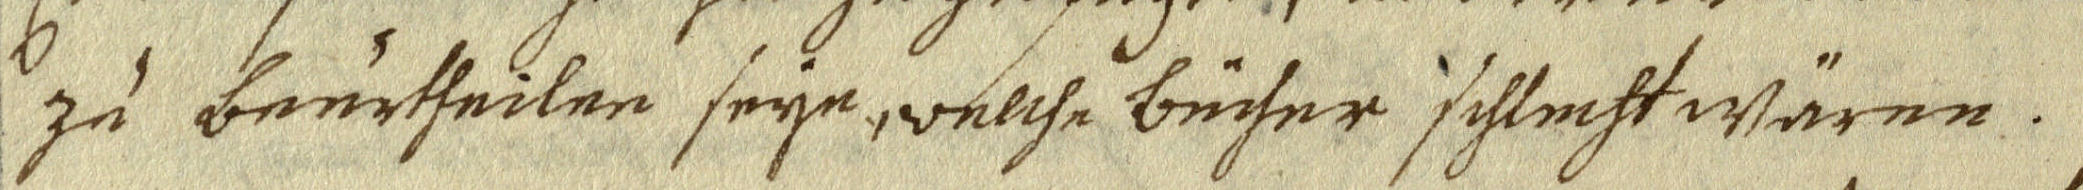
zu beurtheilen seÿn, welche Bücher schlecht wären.
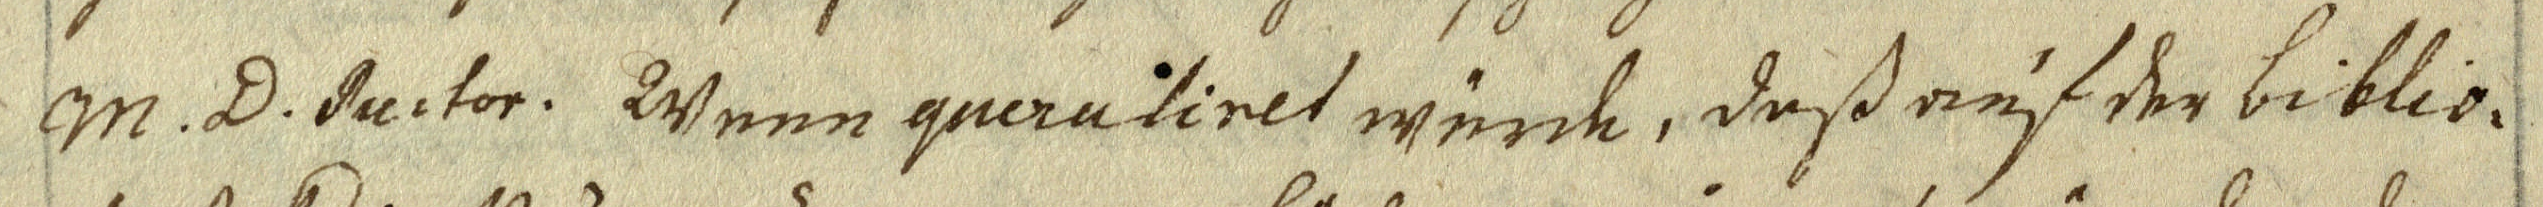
M. D. Rector. Wenn queruliret würde, daß auf der Biblio¬
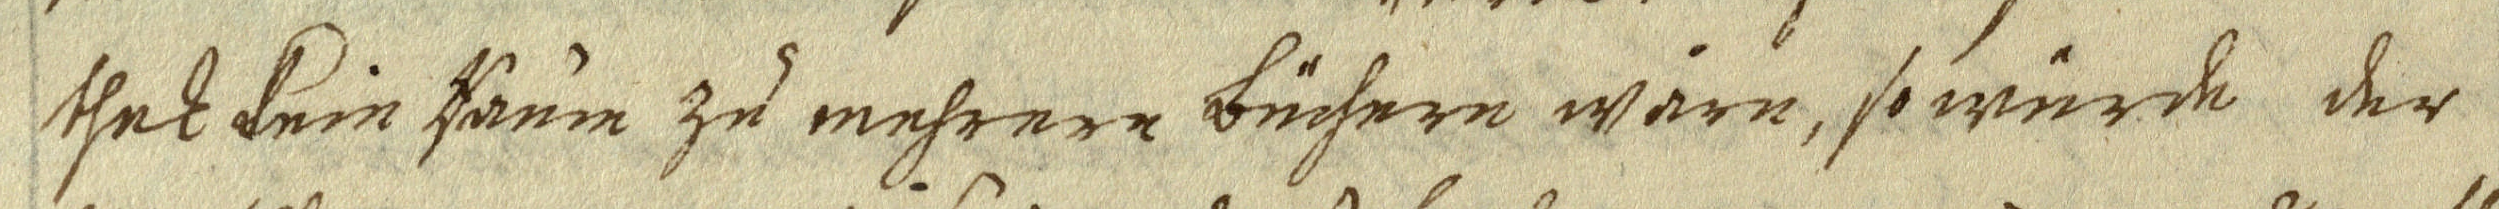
thek kein Raum zu mehrern Büchern wäre, so würde der
